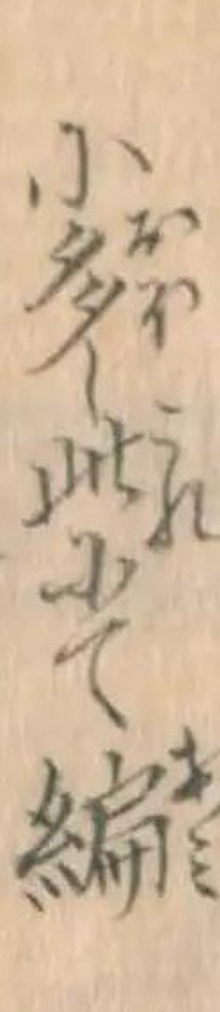に多し此にて編
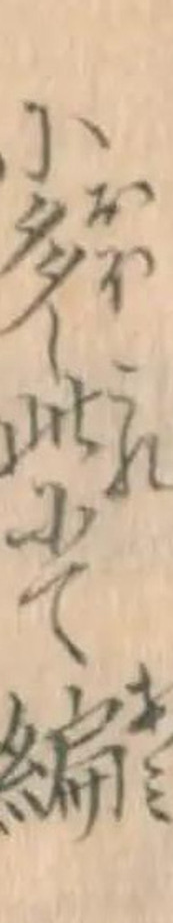に多し此にて編
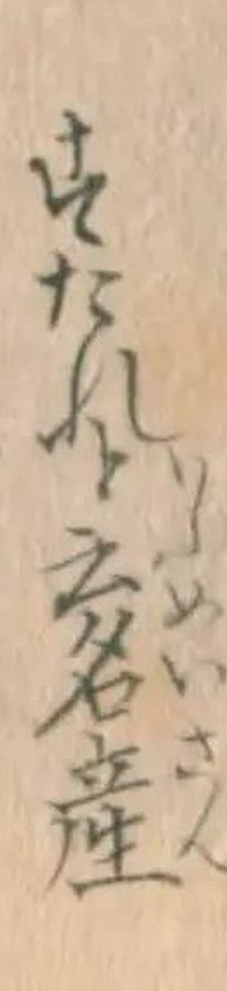すたれと云名産
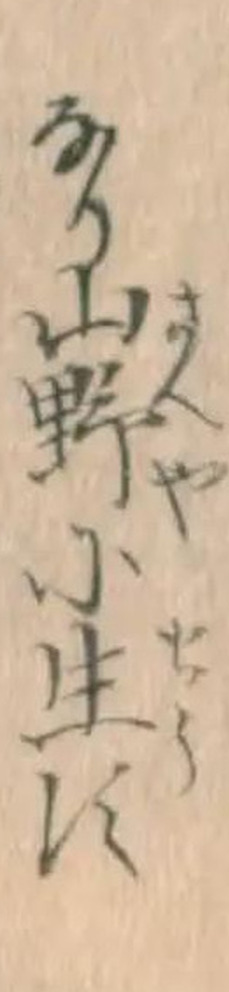なり山野に生ず
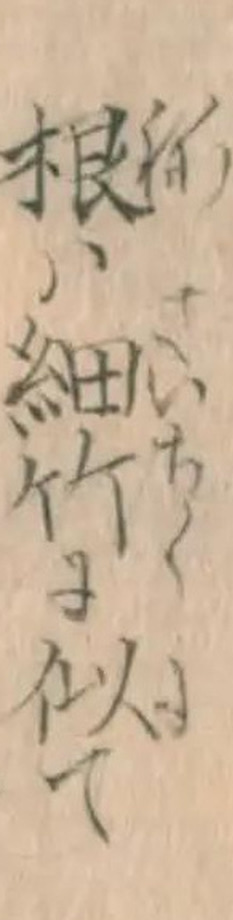根は細竹に似て
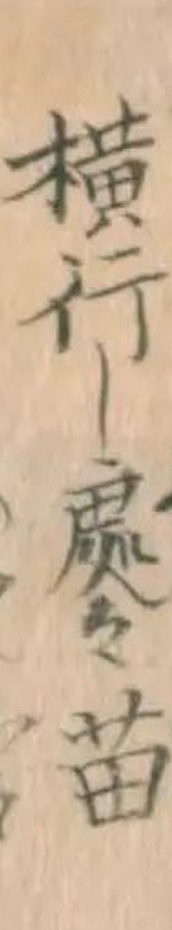横行し處々苗
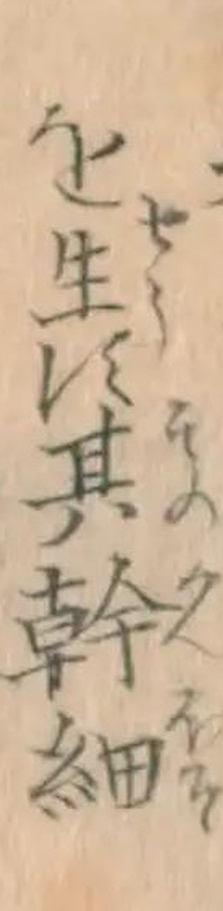を生す其幹細
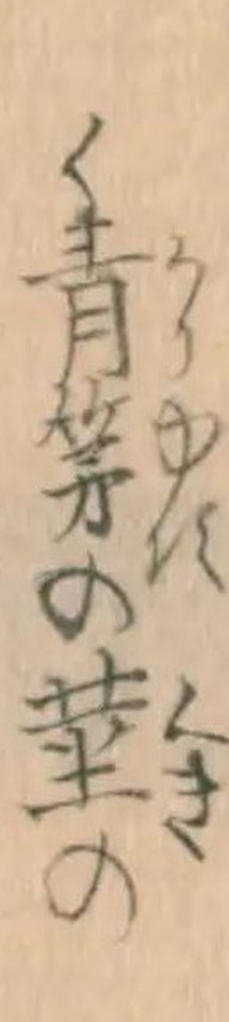く青茅の茎の
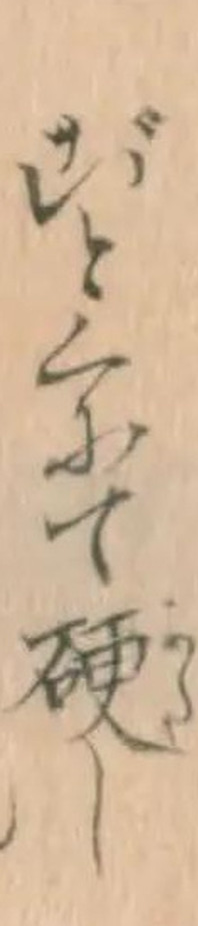ごとくにて硬し
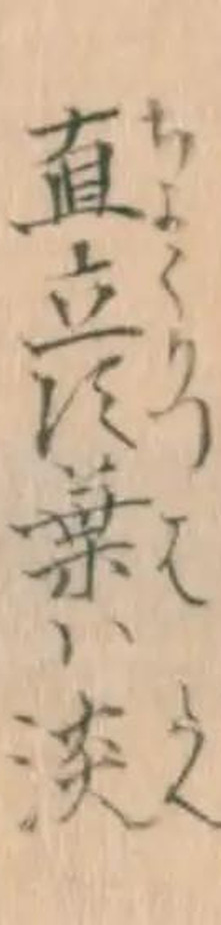直立す葉は淡
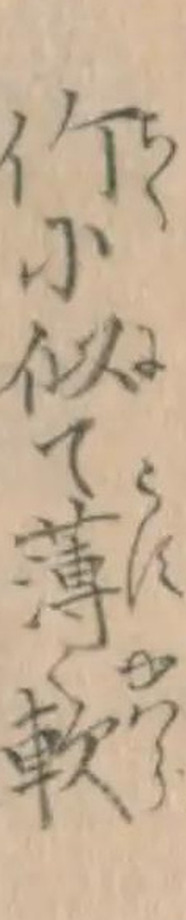竹に似て薄く柔
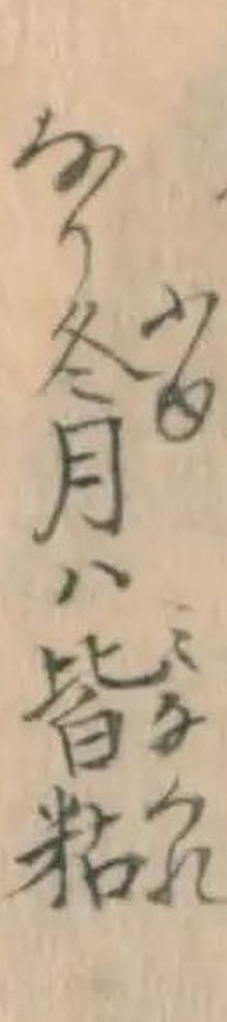なり冬月は皆粘
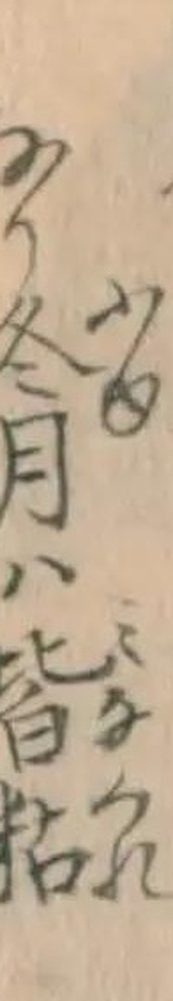なり冬月は皆粘
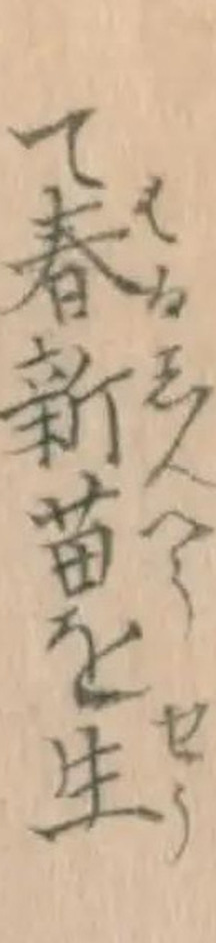て春新苗を生
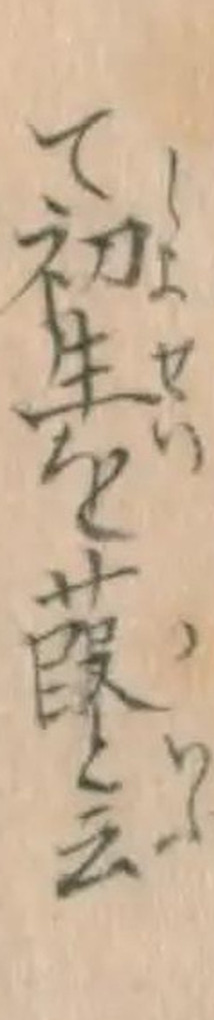て初生を葭と云
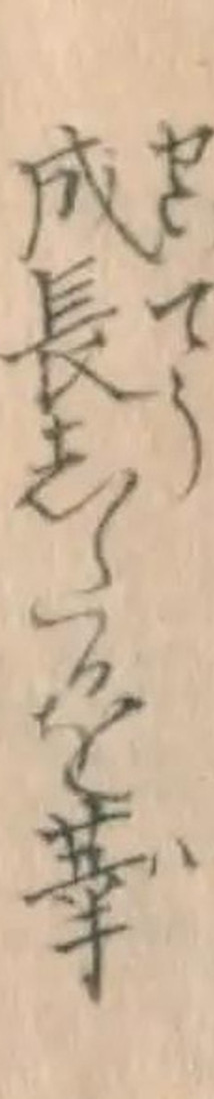成長したるを葦
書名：本草図譜. 巻16-18
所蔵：国立国会図書館 National Diet Library, JAPAN
